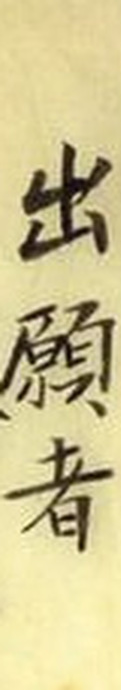出願者
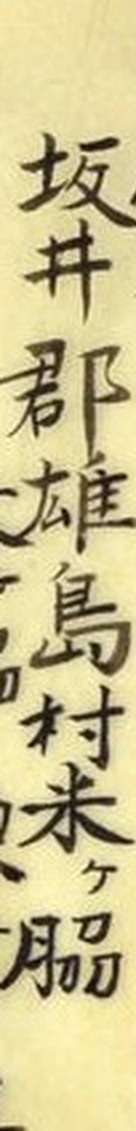坂井郡雄島村米ヶ脇
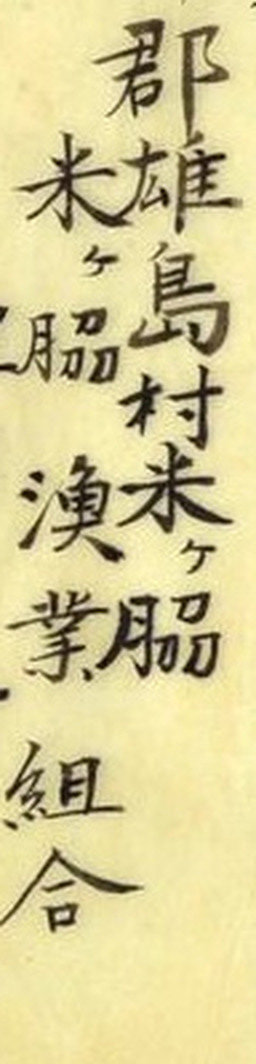米ヶ脇漁業組合
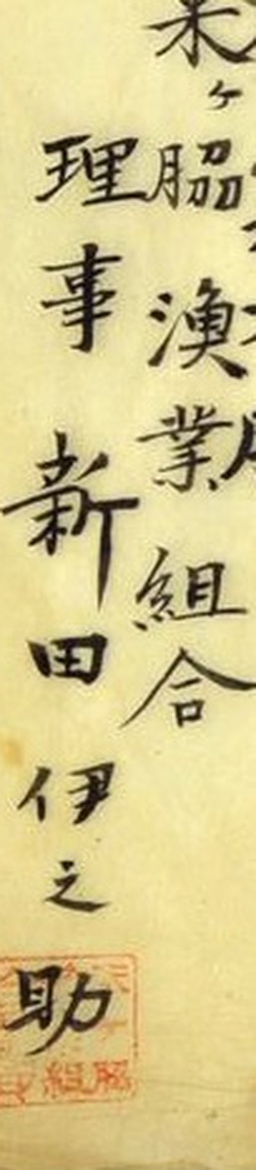理事新田伊之助印
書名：漁具図 若狭海ノ部[画像あり]
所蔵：福井県文書館 Fukui Prefectural Archives
